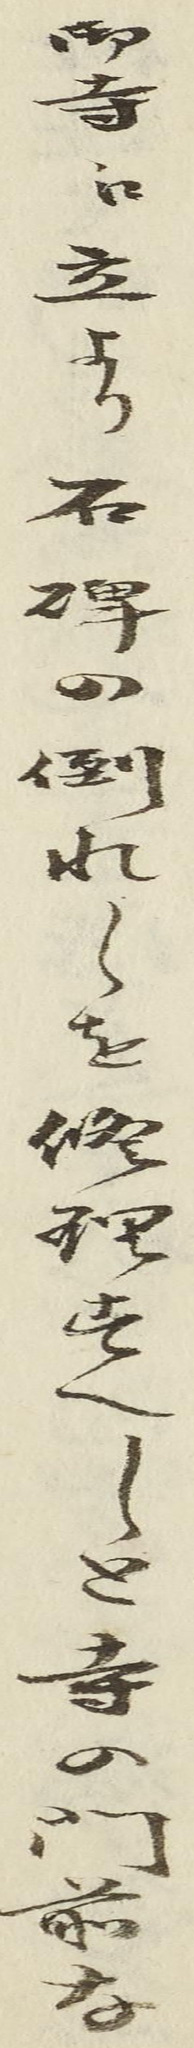御寺江立より石碑の倒れしを修理すへしと寺の門前な
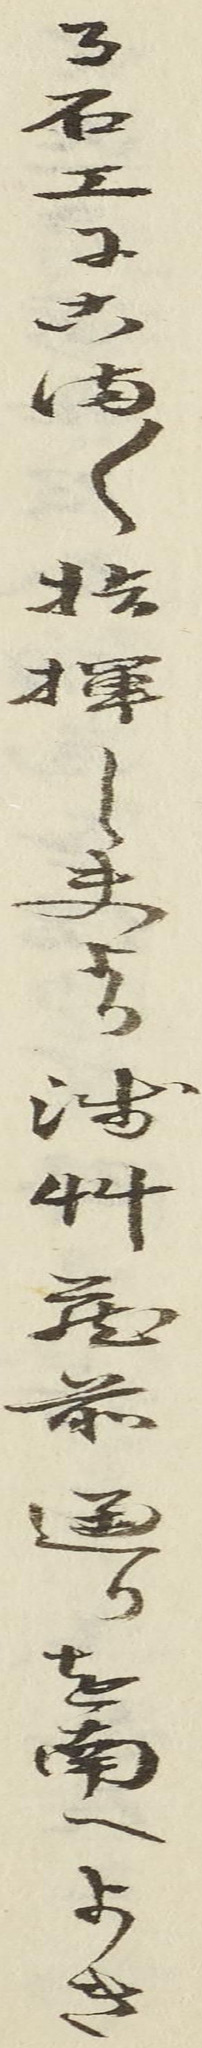る石工にこま〳〵指揮し夫より浅草蔵前通りを南へよき
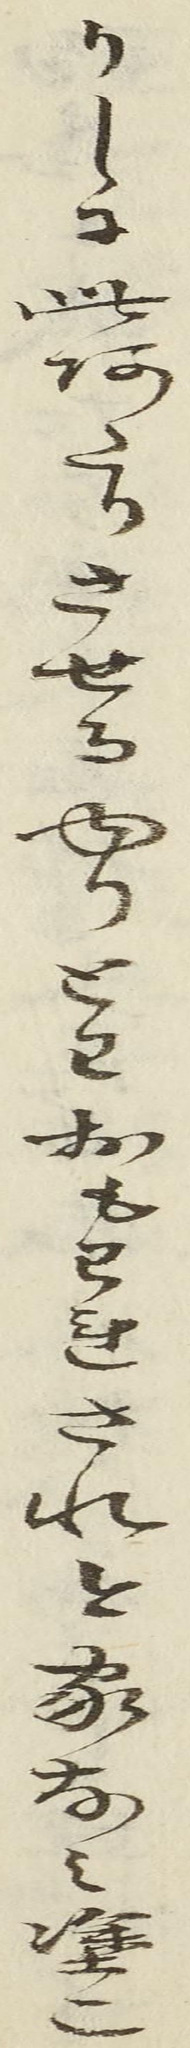りしに此あたりさせるゆりとわおもわれされと家なミ塗こ
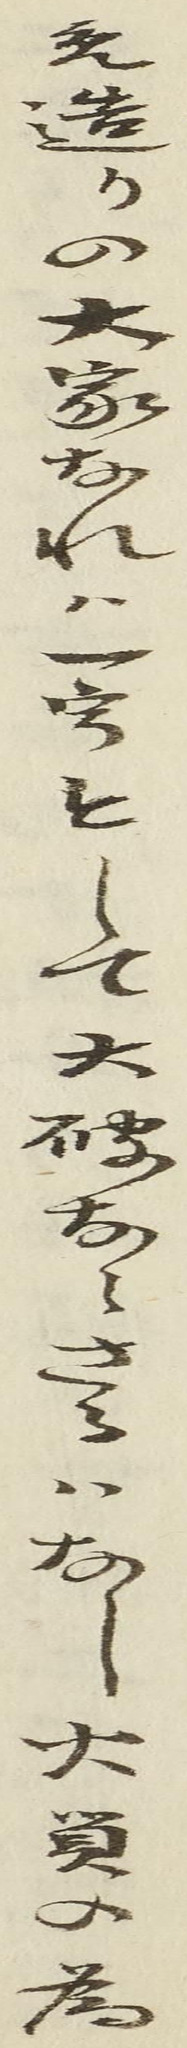め造りの大家なれハ一宇として大破ならさるハなし大災の為
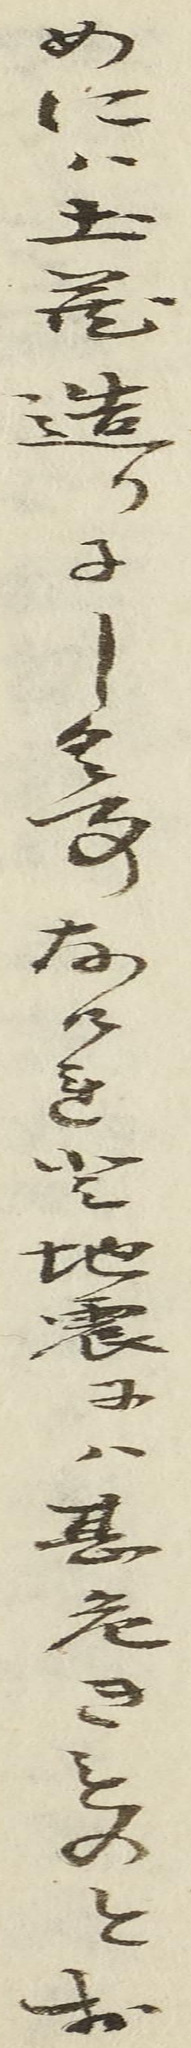めにハ土蔵造りにしく事なけれと地震にハ甚危きものとお
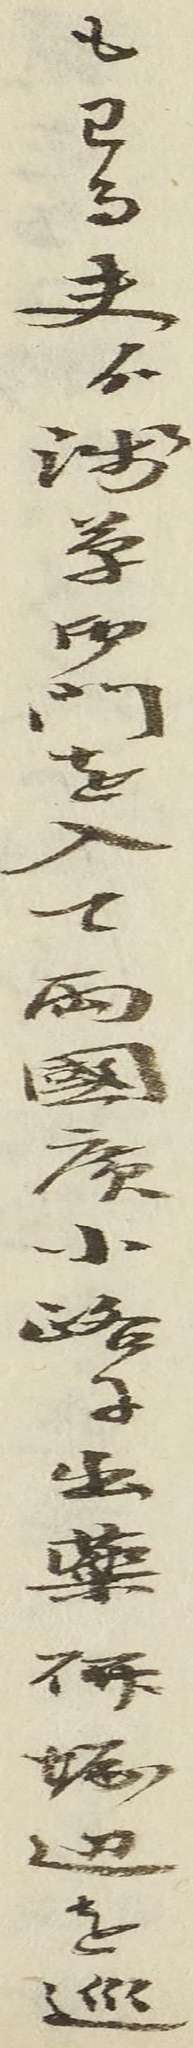もわる夫より浅草御門を入て両国広小路に出薬研堀辺を巡

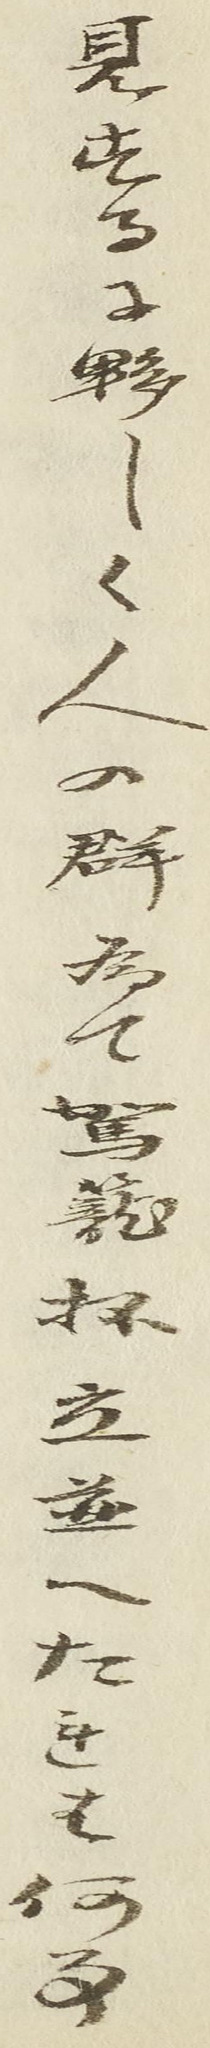見するに夥しく人の群為て駕籠抔立並へたれは何事
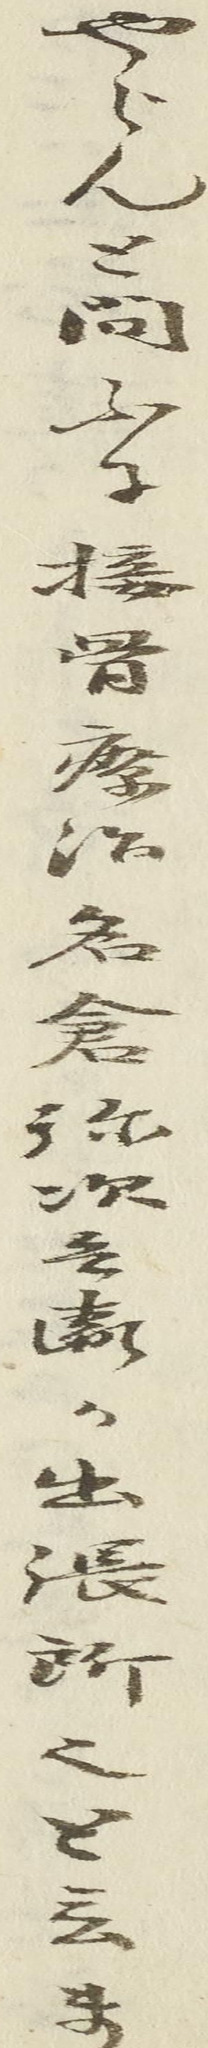やらんと問ふに接骨療治名倉弥次兵衛か出張所也と云まゝ
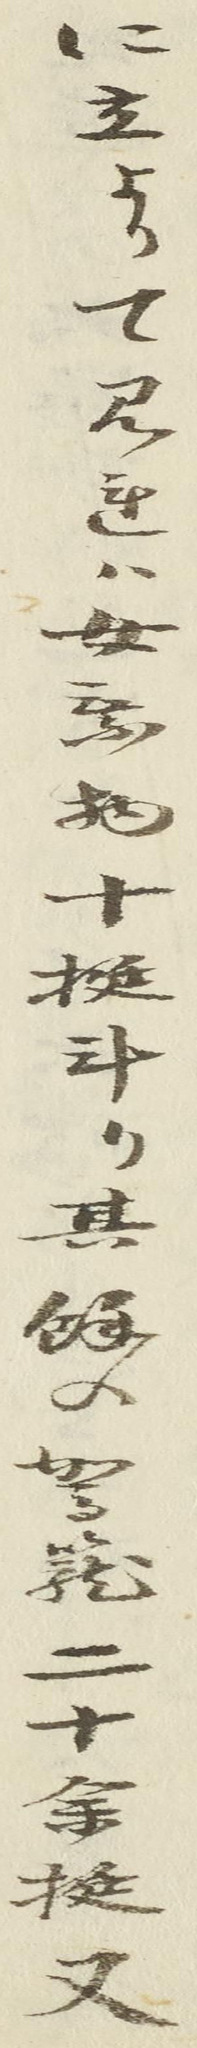に立よりて見れハ女乗物十挺斗り其餘の駕籠二十餘挺又
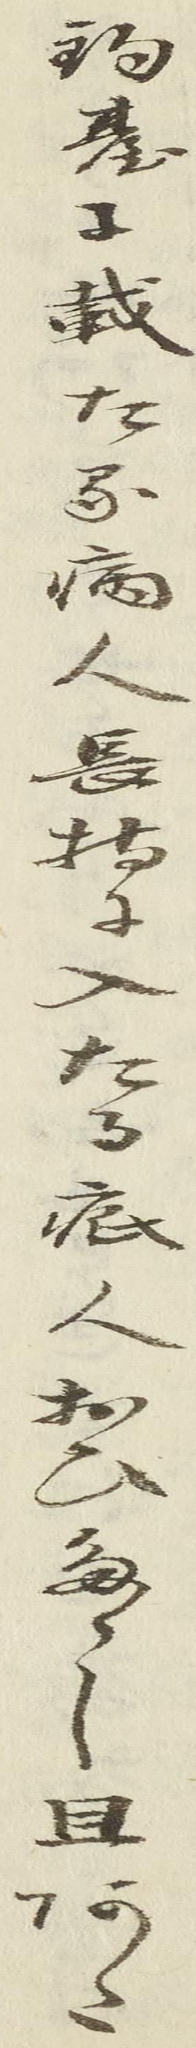釣台に載たる病人長持に入たる疵に人おひたゝし且あた
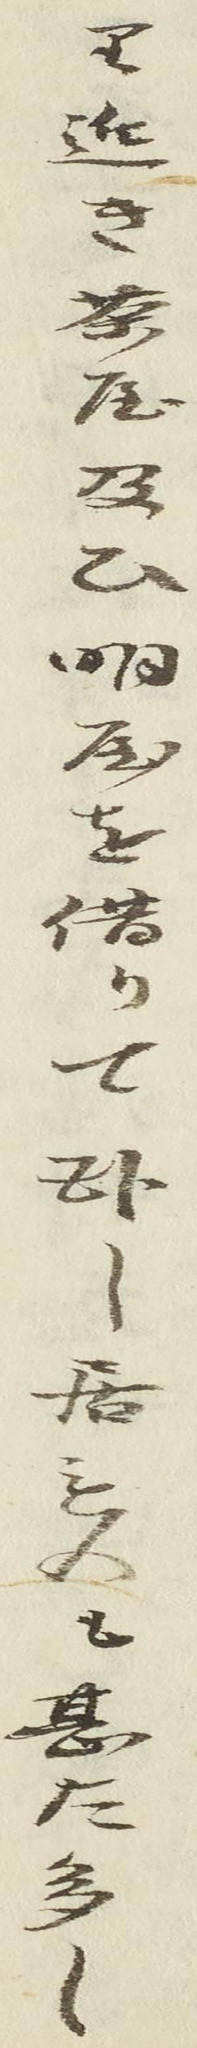り近き茶屋及ひ明屋を借りて臥し居ものも甚た多し
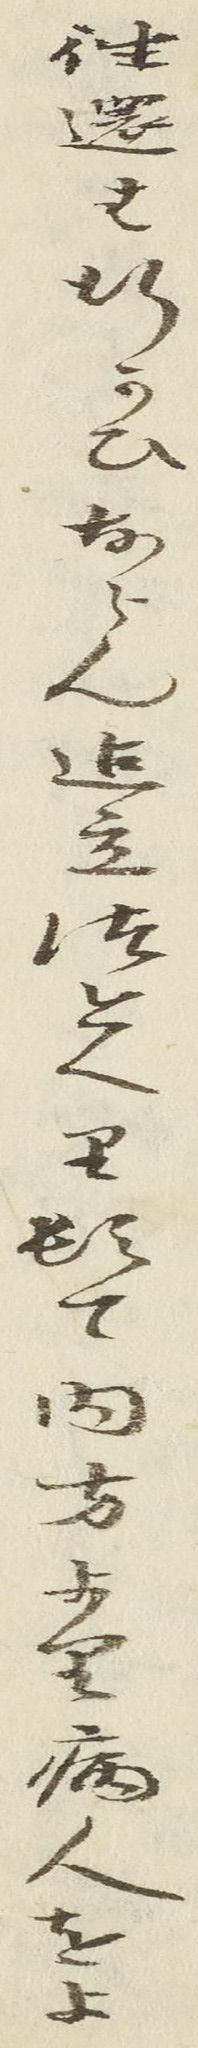往還は行かひならん迄立とへり頓て内方より病人をよ
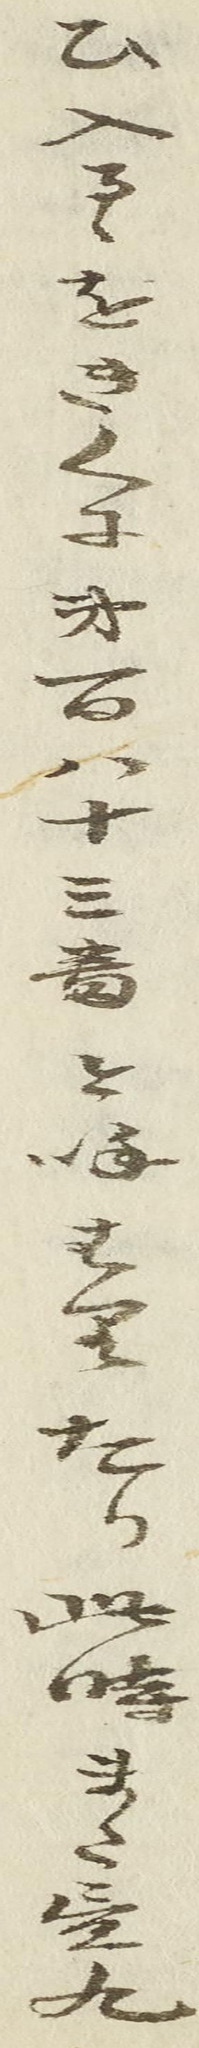ひ入るゝをきくに第百八十三番と呼はりたり此時また昼九
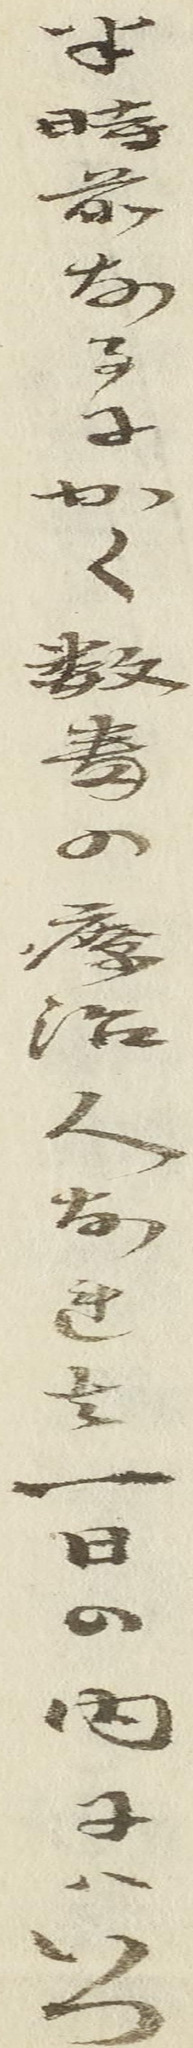半時前なるにかく数多の療治人なれは一日の内にハいつ
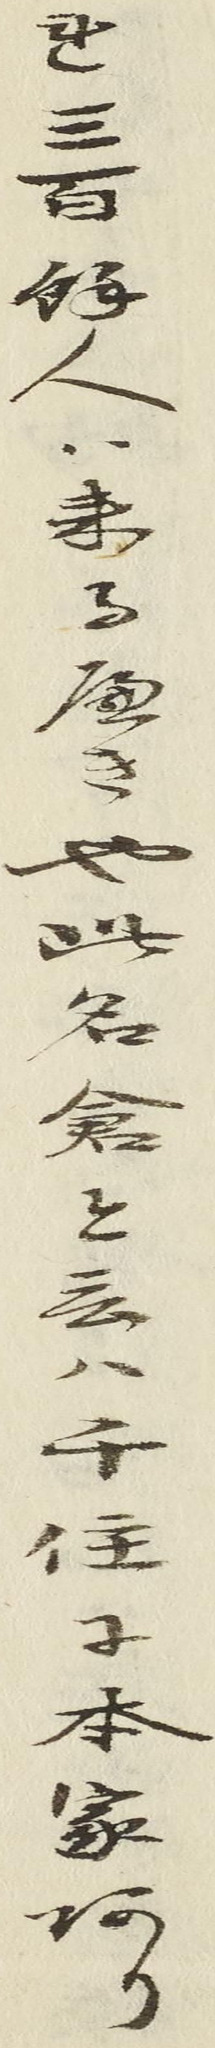れ三百餘人ハ来るへきや此名倉と云ハ千住に本家あり
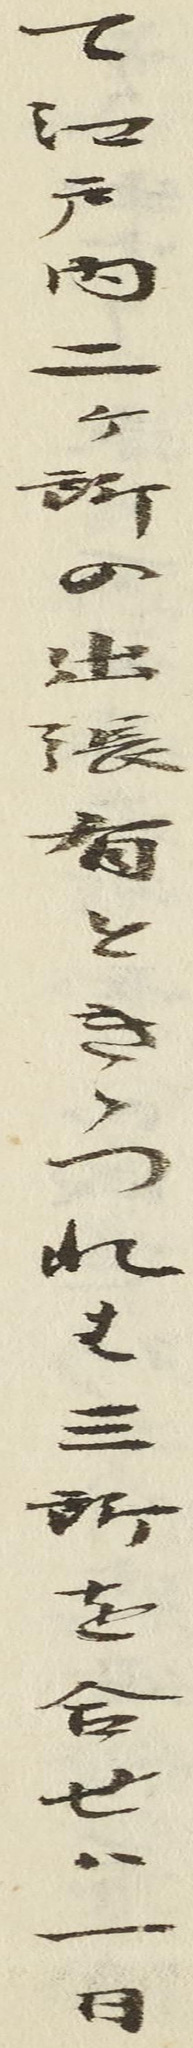て江戸内二ヶ所の出張有ときゝつれは三所を合せハ一日
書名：那為の後見艸　全
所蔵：東京大学地震研究所図書室 Earthquake Research Institute Library, The University of Tokyo, JAPAN
